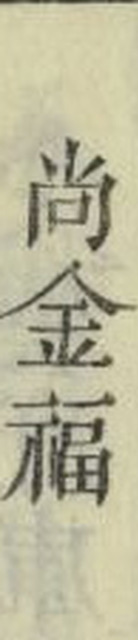尚金福

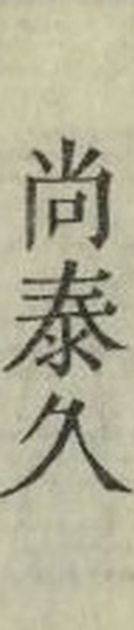尚泰久
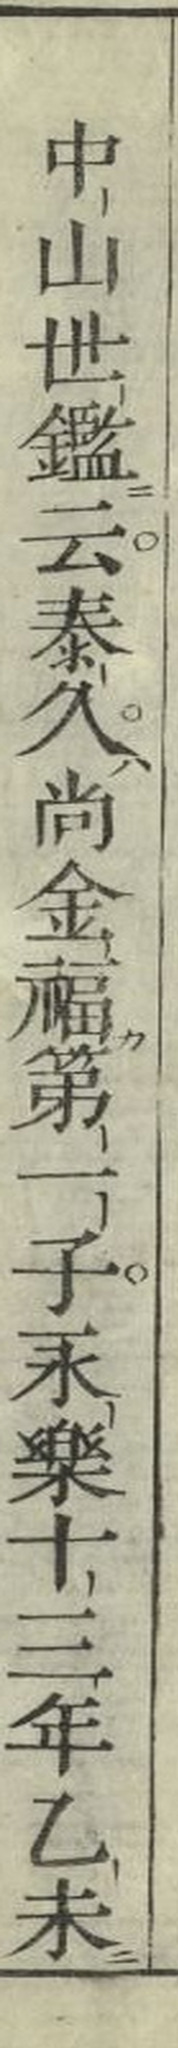中-山世-鑑云。泰-久。尚金-福第-一-子。永-楽十-三-年乙-未

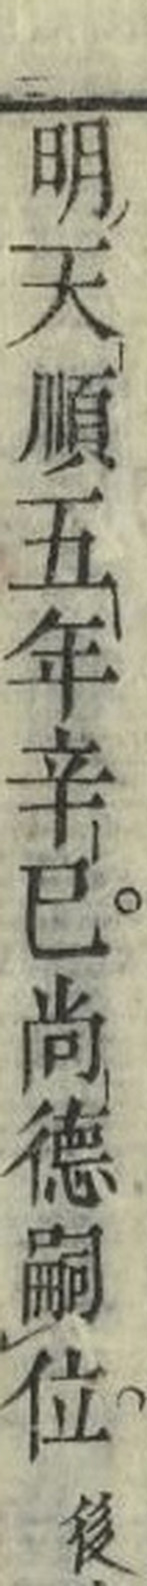明天-順五-年辛-巳。尚-徳嗣位。

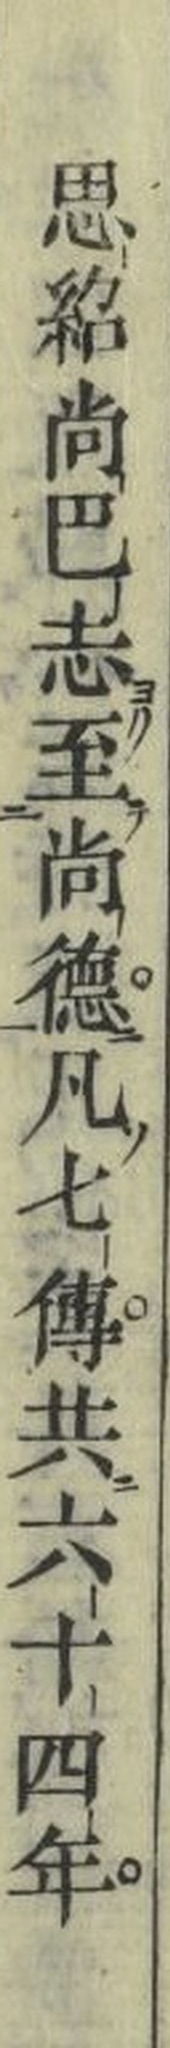思-紹尚-巴-志至尚-徳。凡七-伝。共六-十-四-年。
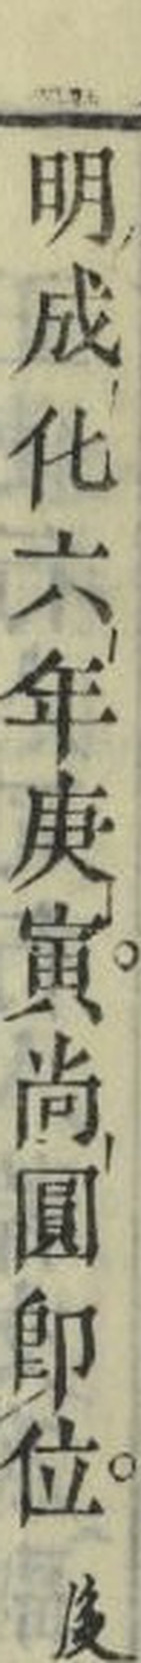明成-化六-年庚-寅。尚-円即位。
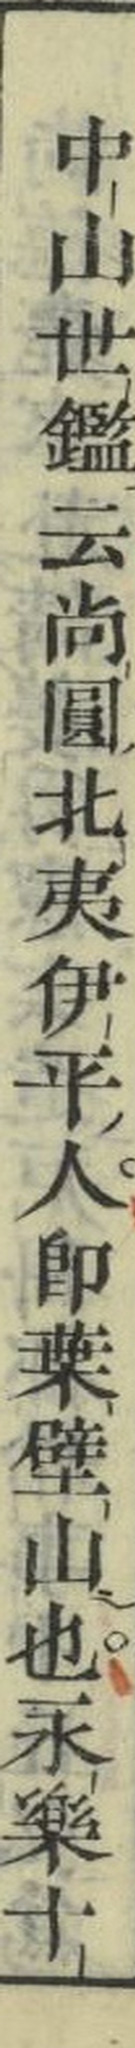中-山世-鑑云。尚-円。北-夷伊-平人。即葉-壁-山也。永-楽十-

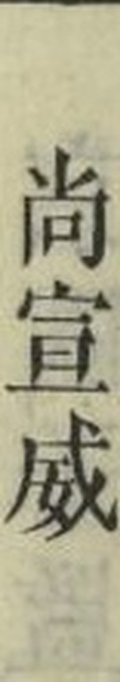尚宣威
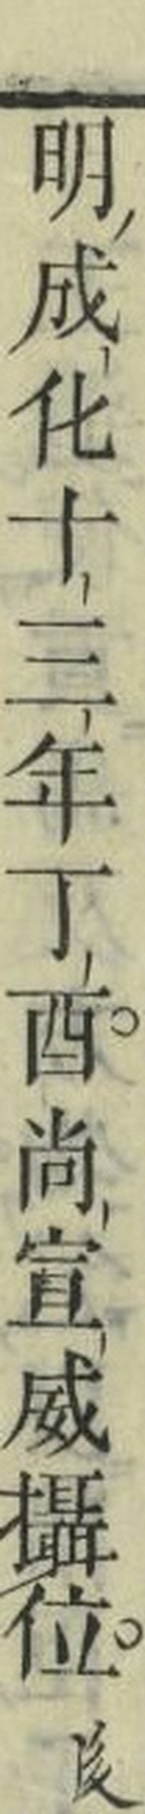明成-化十-三-年丁-酉。尚-宣-威摂位。
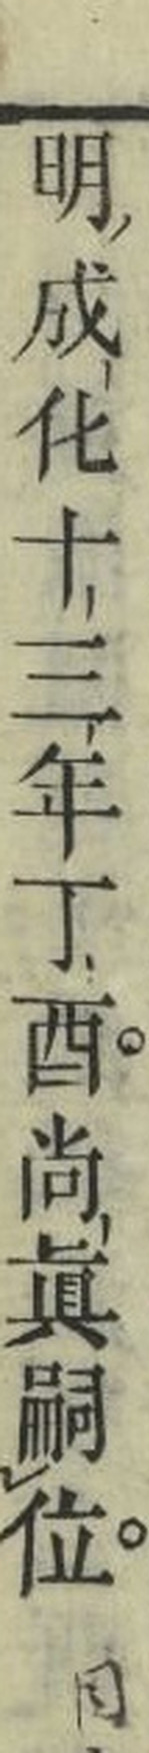明成-化十-三-年丁-酉。尚-真嗣位。

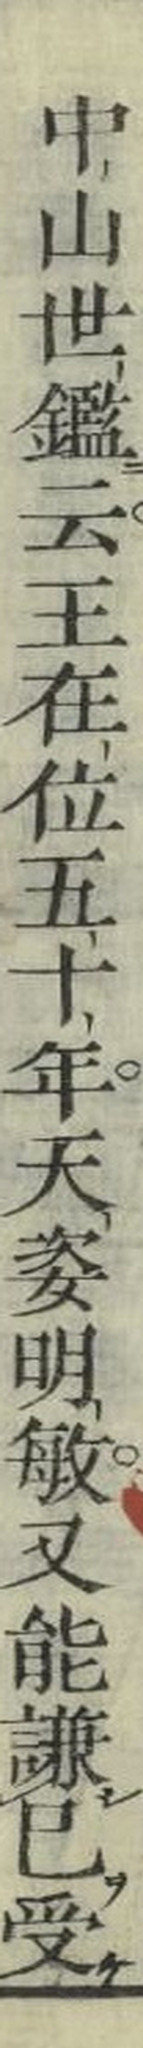中-山世-鑑云。王在-位五-十-年。天-姿明-敏。又能謙巳受

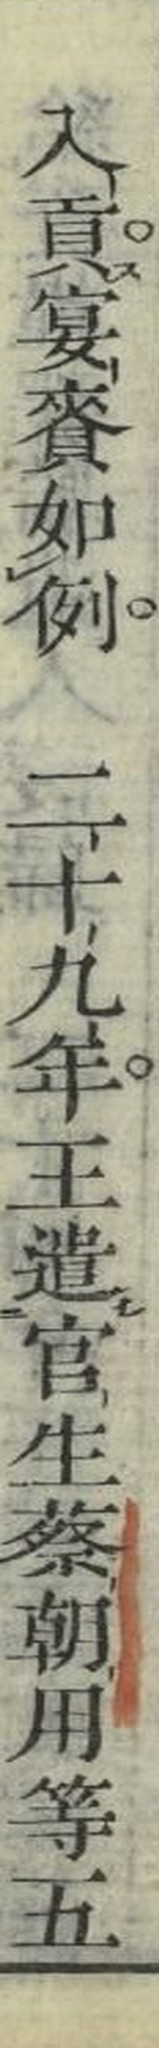入-貢。宴-賚如例。二-十-九-年。王遣官-生蔡-朝-用等五

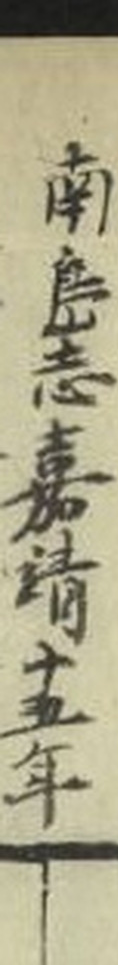南島志嘉靖十五年
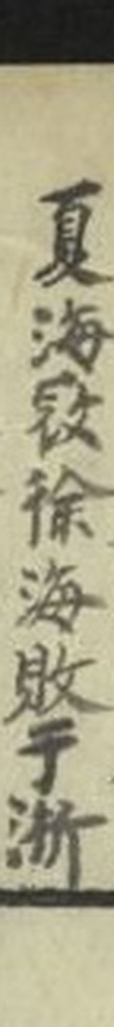夏海寇徐海敗亍浙
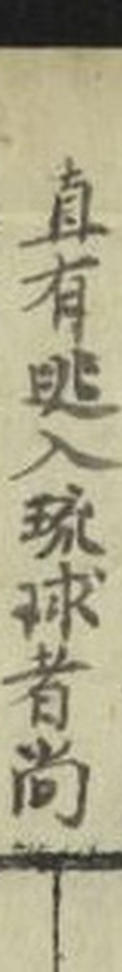直有逃入琉球者尚
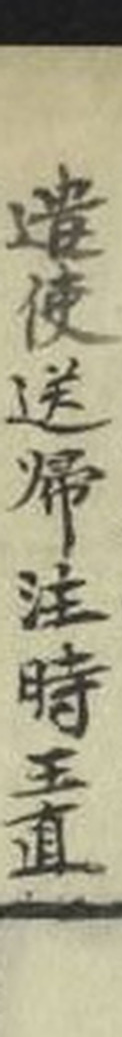遣使送帰注時王直
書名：中山伝信録 巻三
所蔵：University of the Ryukyus Library
